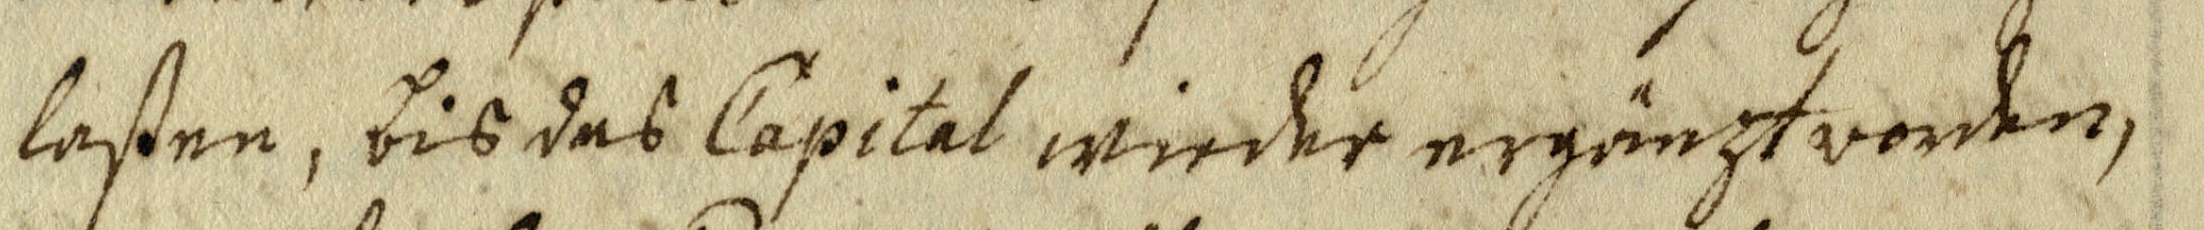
laßen, bis das Capital wieder ergänzt worden,
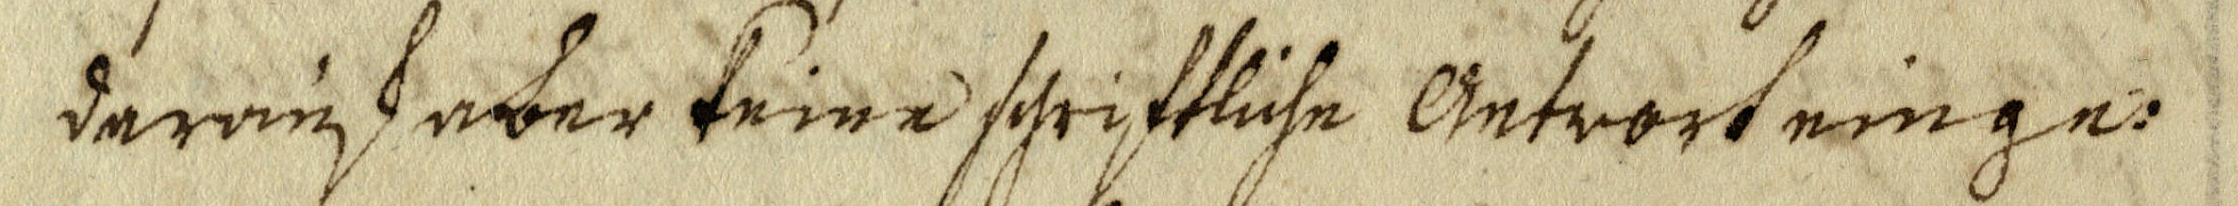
darauf aber keine schriftliche Antwort einge¬
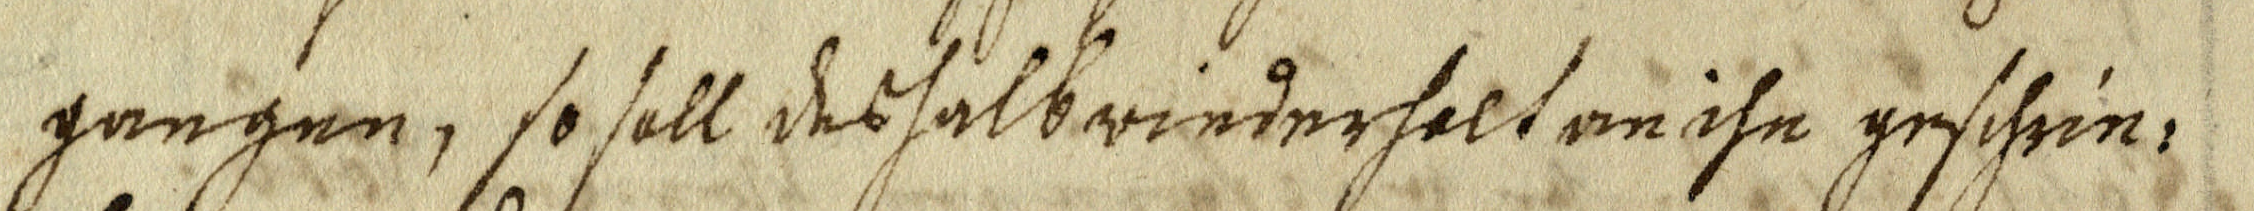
gangen, so soll deshalb wiederholt an ihn geschrie¬
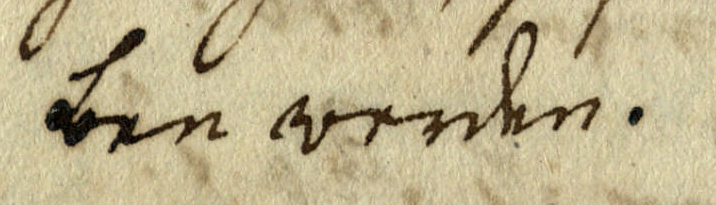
ben werden.
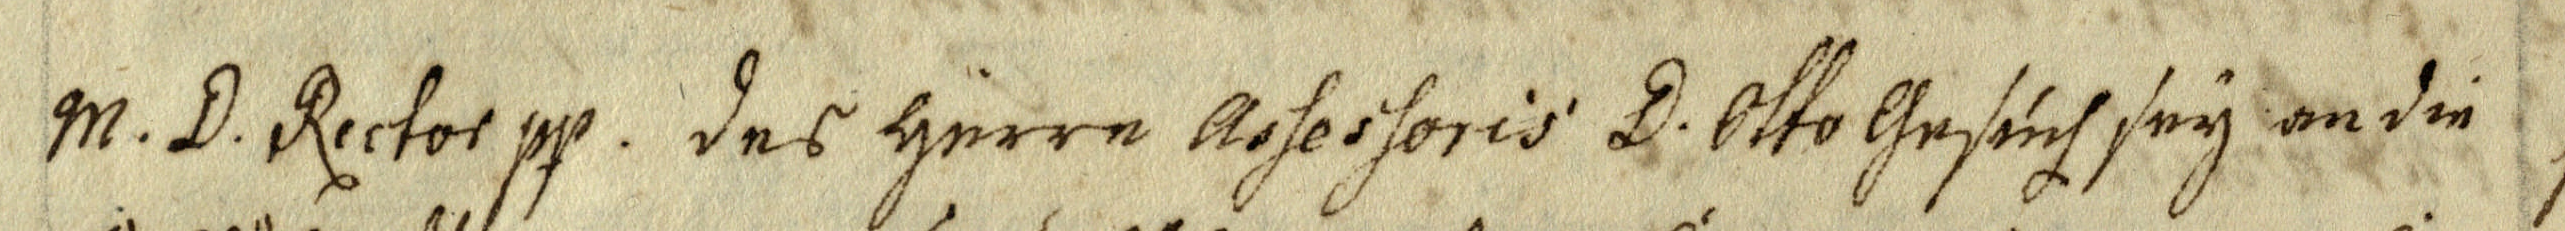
M. D. Rector. pp. Des Herrn Assessoris Otto Gesuch seÿ an die
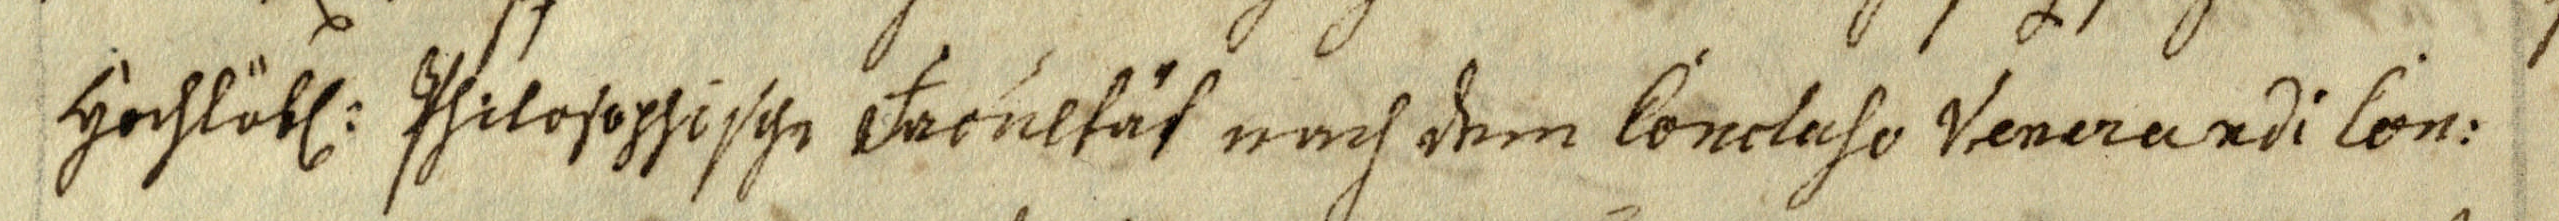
Hochlöbl. Philosophische Facultät nach dem Concluso Venerandi Con¬
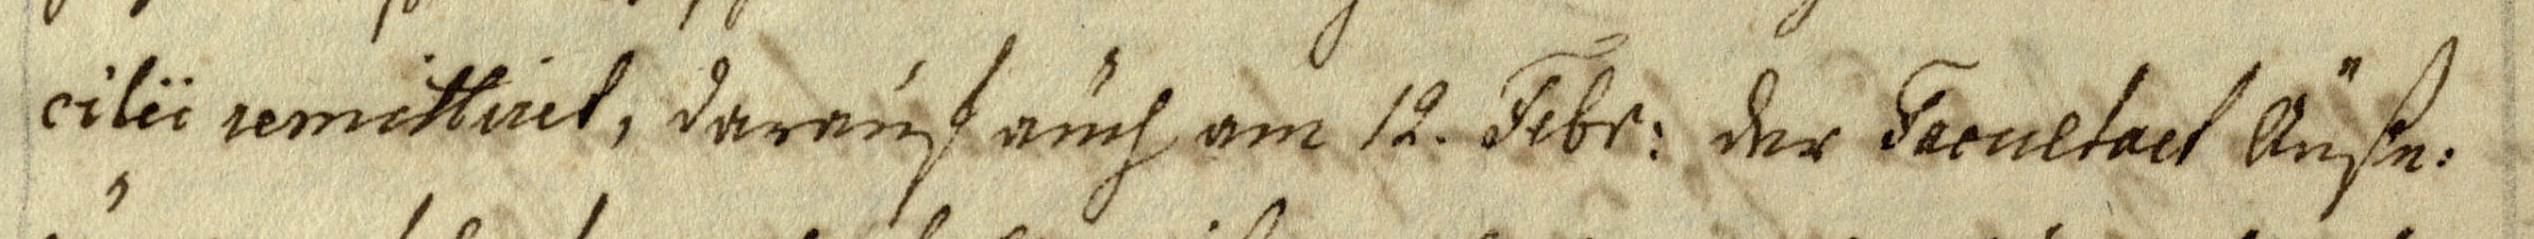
cilii remittiret, darauf auch am 12. Febr. der Facultaet Äuße¬
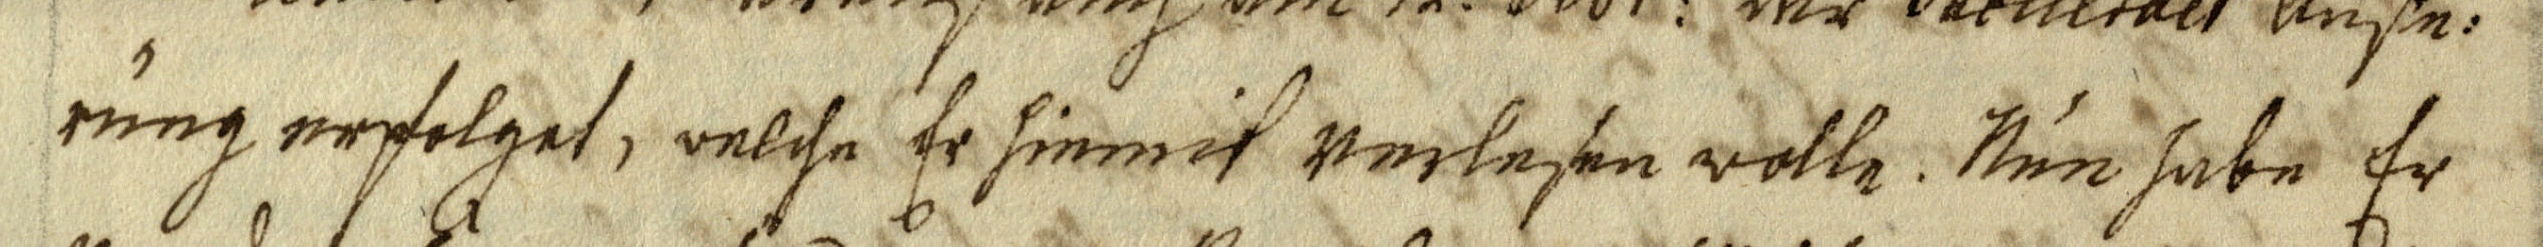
rung erfolget, welche Er hiemit verlesen wolle. Nun habe Er
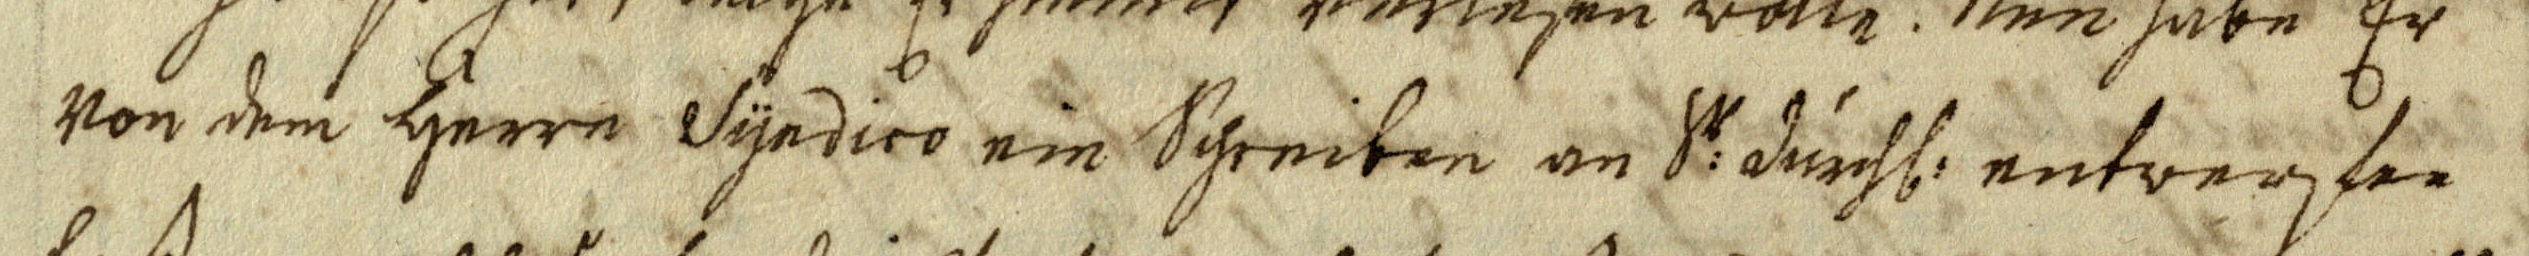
von dem Herrn Sÿndico ein Schreiben an Sr Durchl. entwerfen
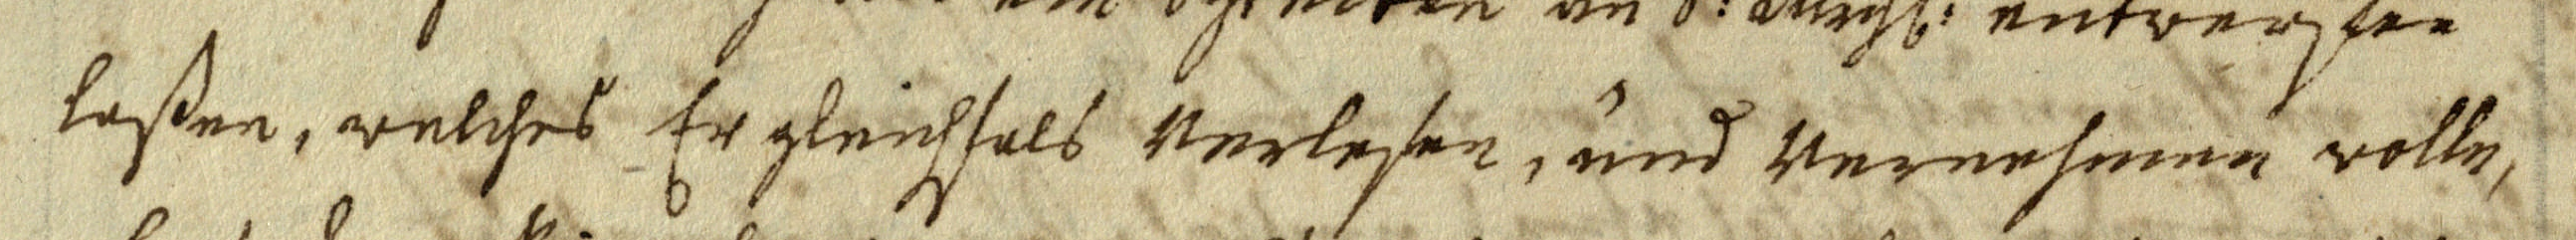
laßen, welches Er gleichfals verlesen, und vernehmen wolle,
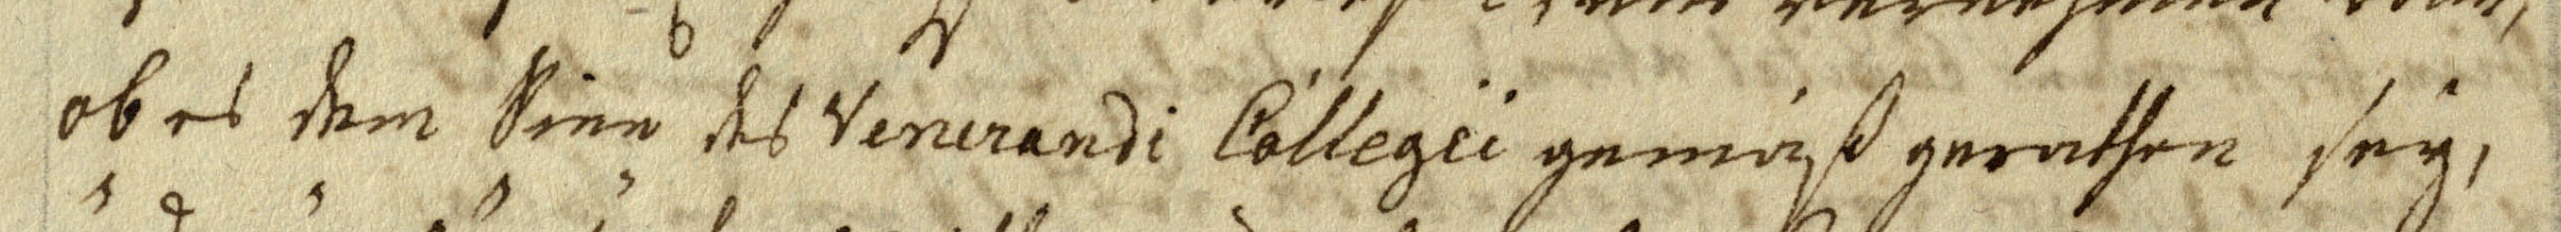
ob es dem Sinn des Venerandi Collegii gemäß gerathen seÿ,
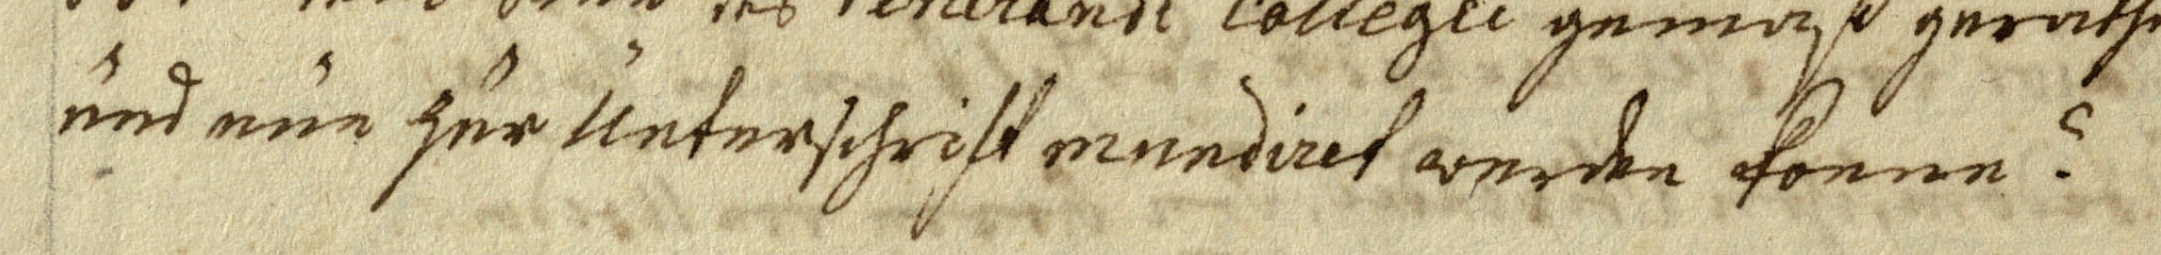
und nun zur Unterschrift mundiret werden könne?
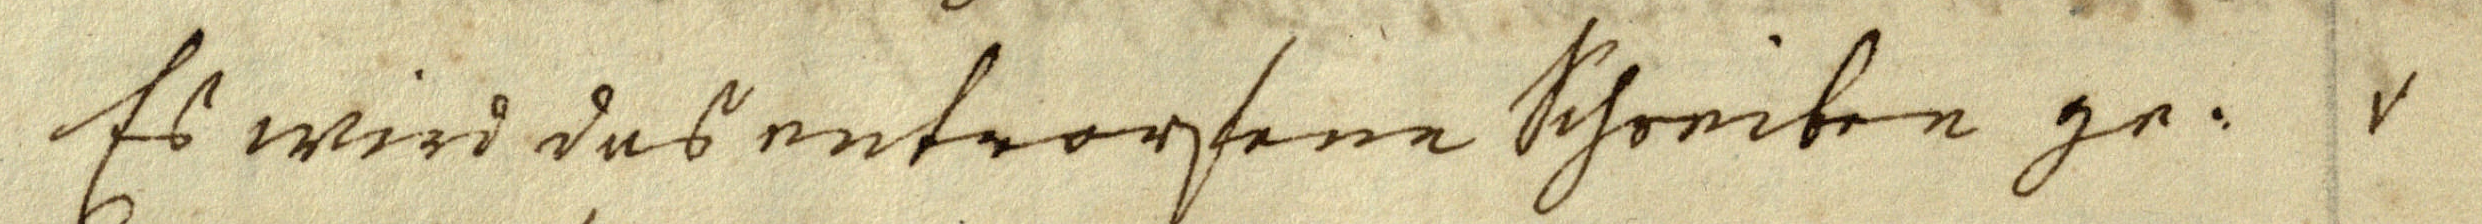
Es wird das entworfene Schreiben ge¬
